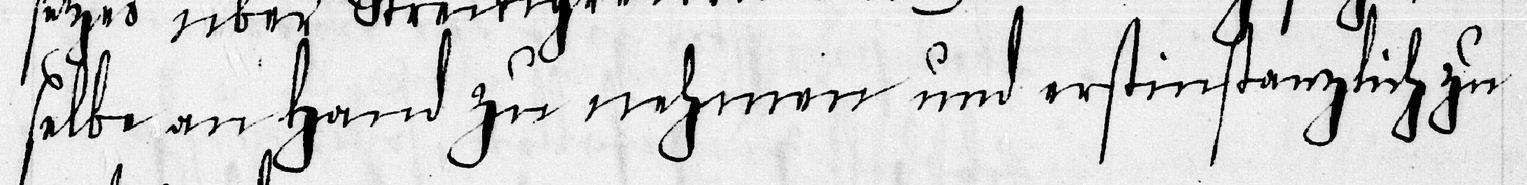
selbe an Hand zu nehmen und erstinstanzlich zu
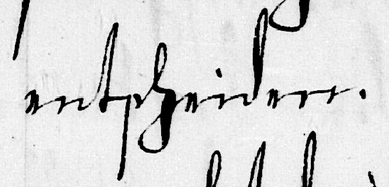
entscheiden.
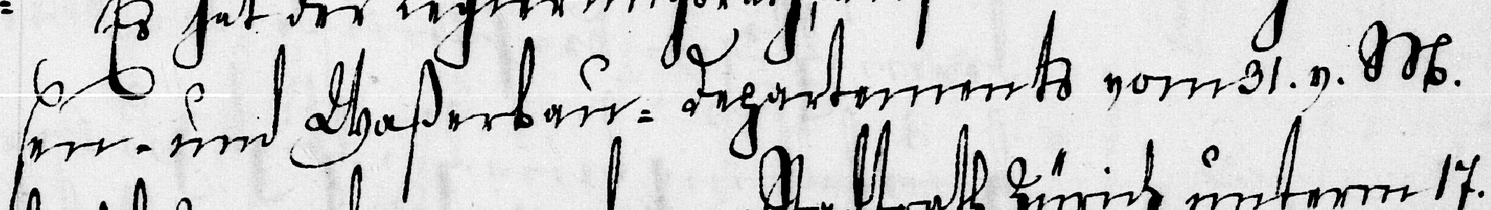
ßen- und Waßerbau-Departements vom 31. v. M.
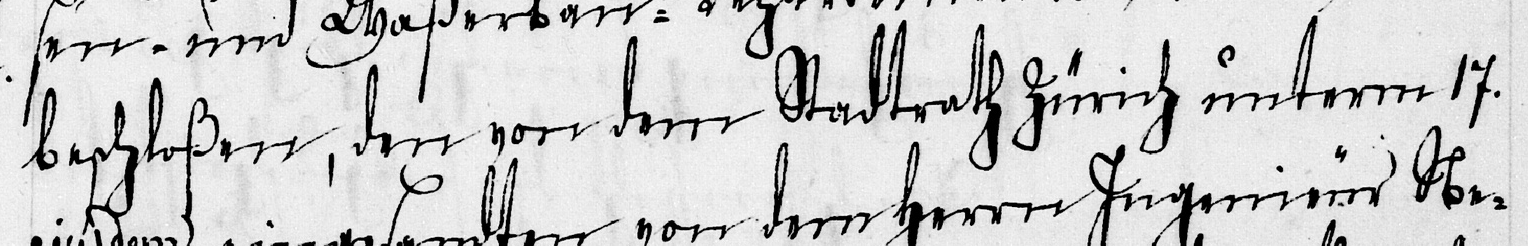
beschloßen, den von dem Stadtrath Zürich unterm 17.
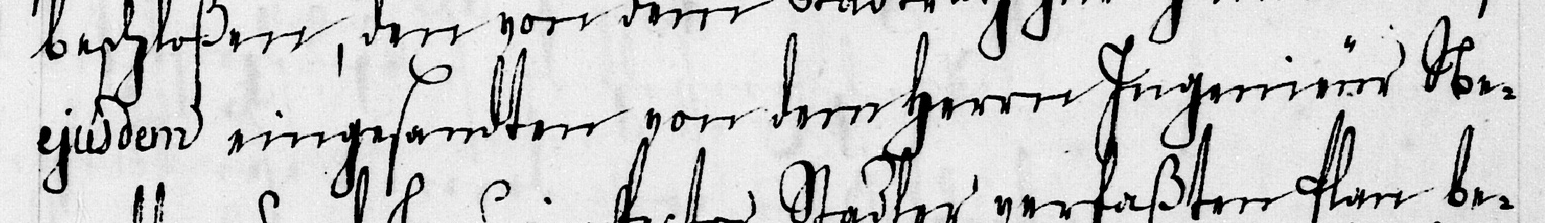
ejusdem eingesandten von dem Herrn Ingenieur Ne¬
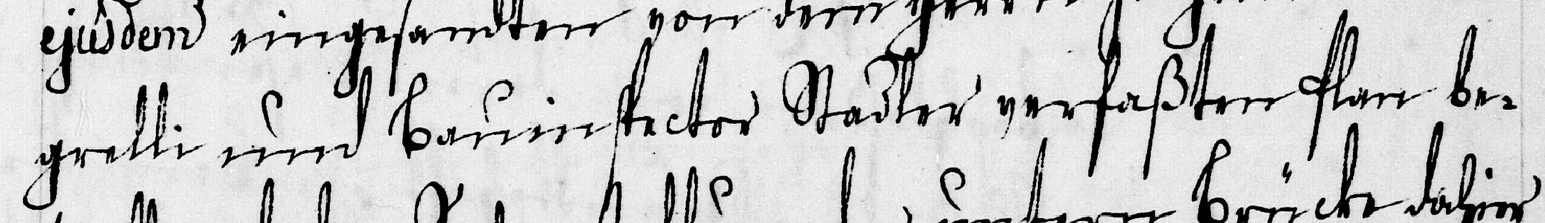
grelli und Bauinspector Stadler verfaßten Plan be¬
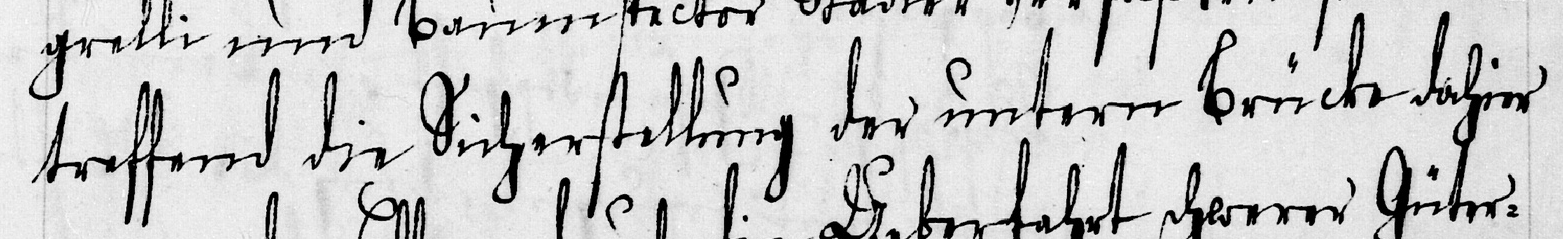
treffend die Sicherstellung der untern Brücke dahier
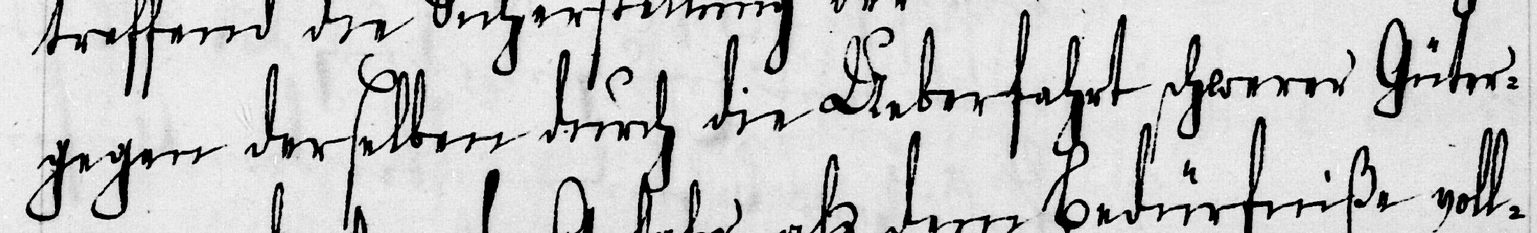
gegen derselben durch die Ueberfahrt schwerer Güter¬
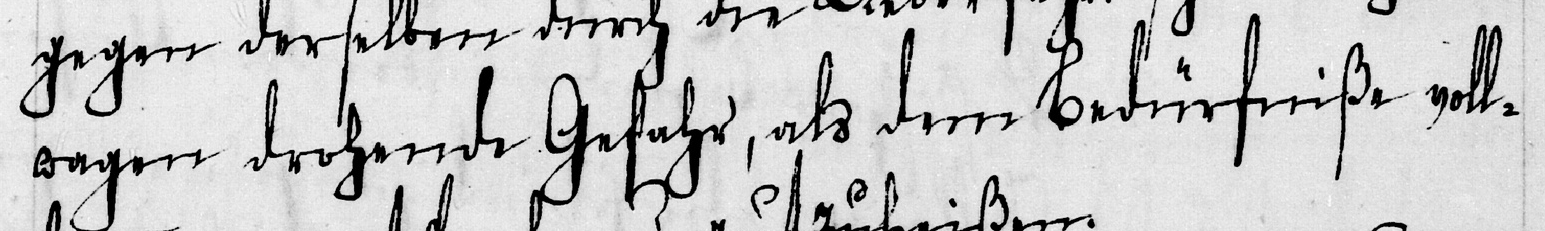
wagen drohenden Gefahr, als dem Bedürfniße voll¬
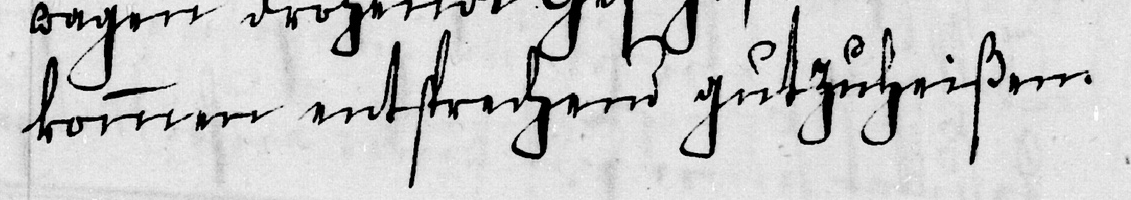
kommen entsprechend gutzuheißen.
